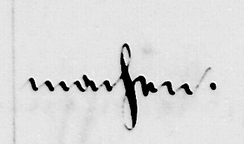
machen.
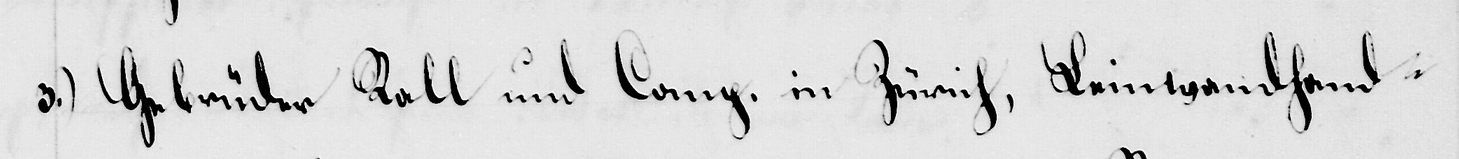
3.) Gebrüder Rall und Comp. in Zürich, Leinwandhand¬
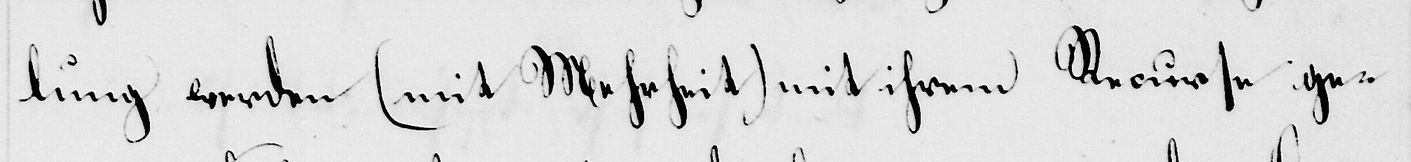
lung werden (mit Mehrheit) mit ihrem Recurse ge¬
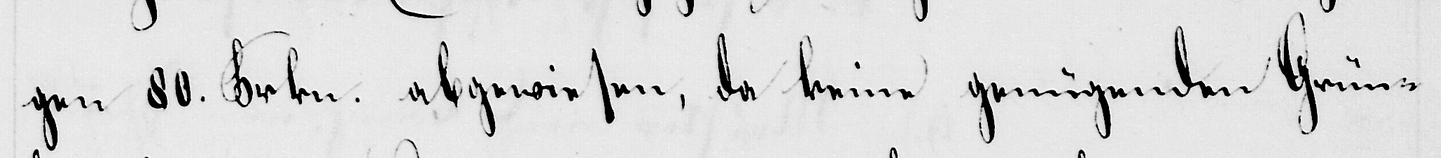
gen 80. Frkn. abgewiesen, da keine genügenden Grün¬
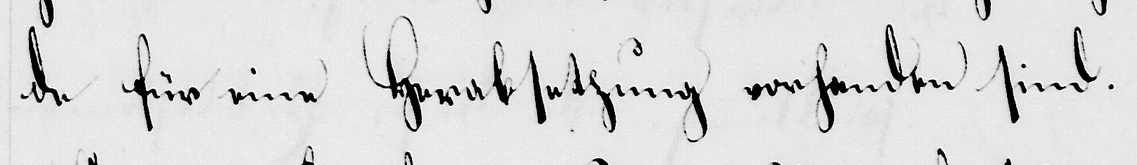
de für eine Herabsetzung vorhanden sind.
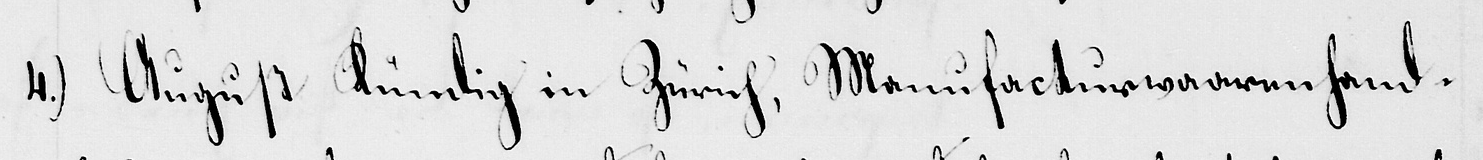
4.) August Kündig in Zürich, Manufacturwaarenhand¬
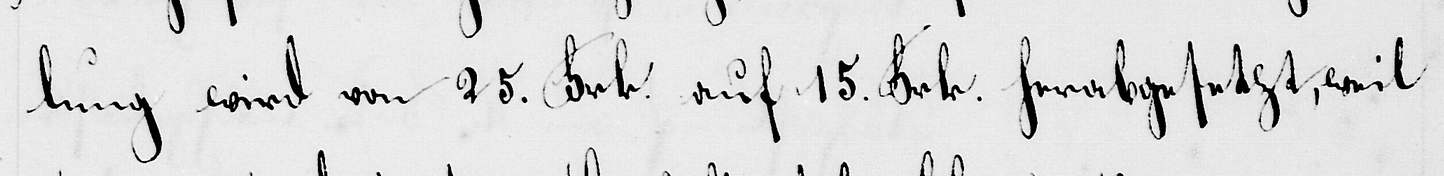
lung wird von 25. Frk. auf 15. Frk. herabgesetzt, weil
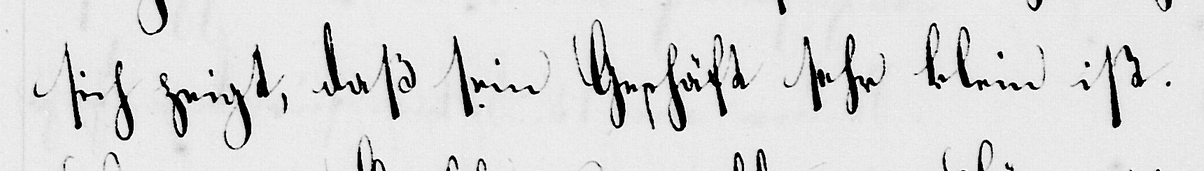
sich zeigt, daß sein Geschäft sehr klein ist.
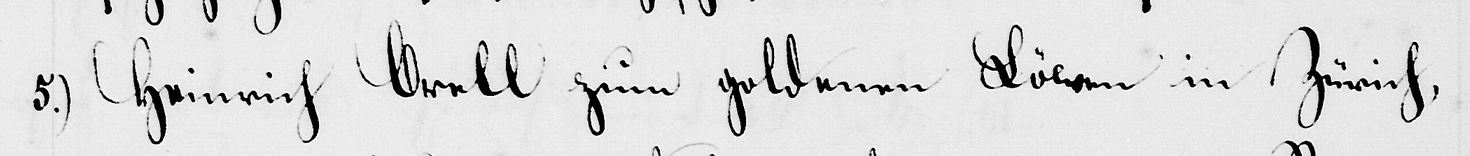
5.) Heinrich Orell zum goldenen Löwen in Zürich,
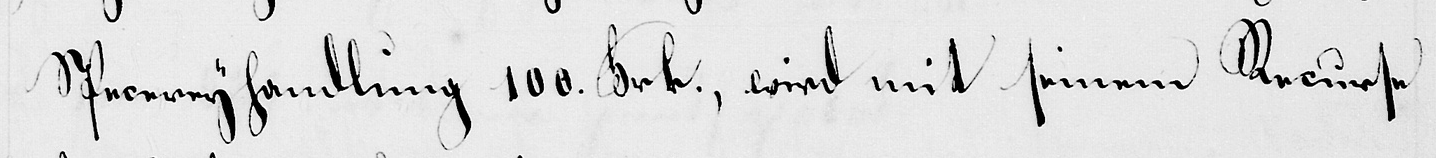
Specereyhandlung 100. Frk., wird mit seinem Recurse
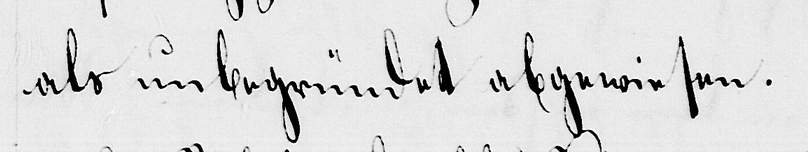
als unbegründet abgewiesen.
